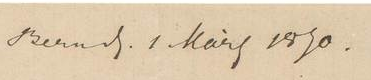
Bern d. 1 März 1870.
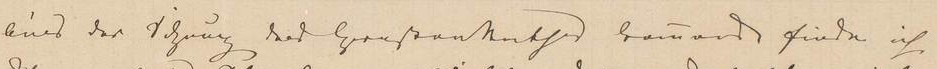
Aus der Sitzung des Großen Rathes kommend, finde ich
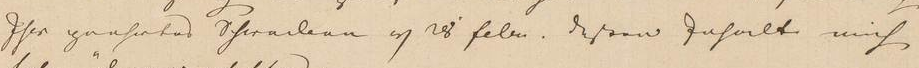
Ihr geehrtes Schreiben v. 28t Febr , deßen Inhalt mich
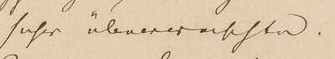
sehr überraschte.
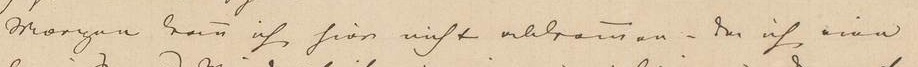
Morgen kann ich hier nicht abkommen, da ich eine
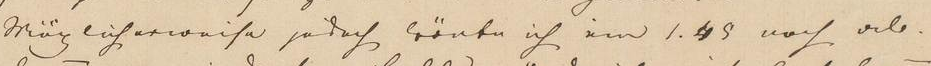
Möglicherweise jedoch könte ich um 1.45 noch ab-
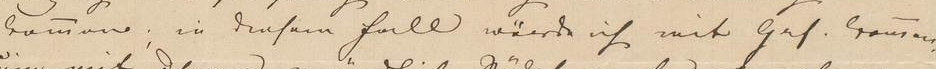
kommen; in diesem Fall würde ich mit Gef. kommen,
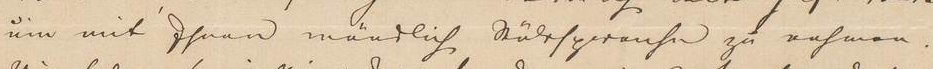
um mit Ihnen mündlich Rüksprache zu nehmen.
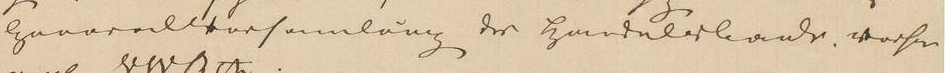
GeneralVersamlung der Handelsbank vorher
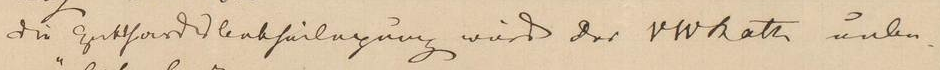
Die Gothardsbetheiligung wird der VWRath unbe-
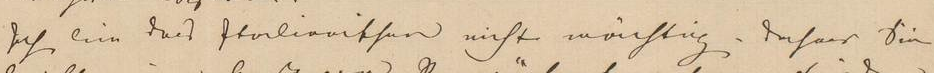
Ich bin des Italienischen nicht mächtig, daher Sie
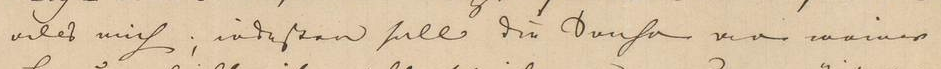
als mich; indeßen soll die Sache an meiner
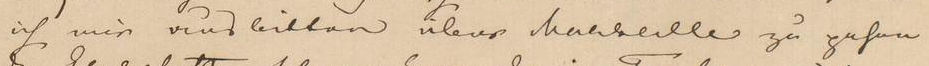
ich mir ausbitten über Marseille zu gehen
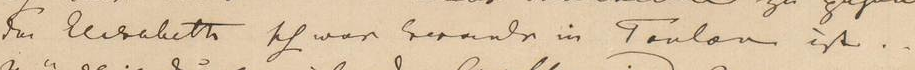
da Elisabeth schwer krank in Toulon ist.
